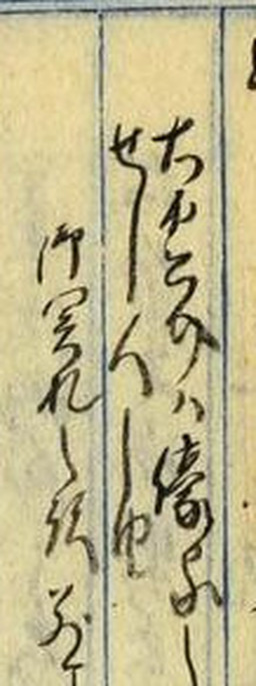せし人之由
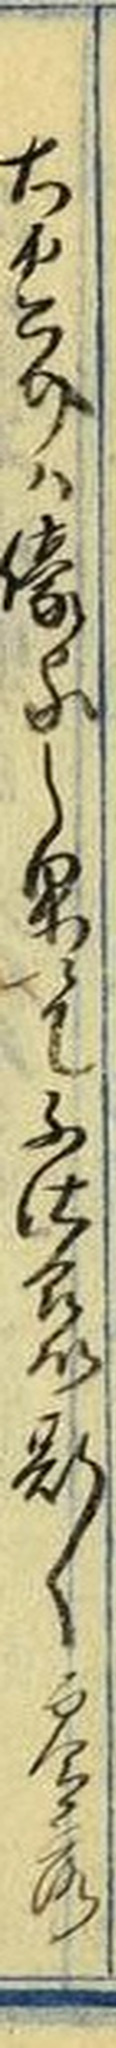右雲介は豪家之果にて不仕合故斯く零落
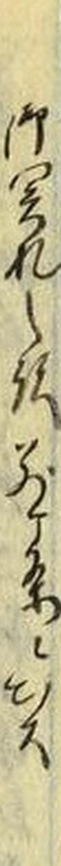御関札之訳別ケ条に出候
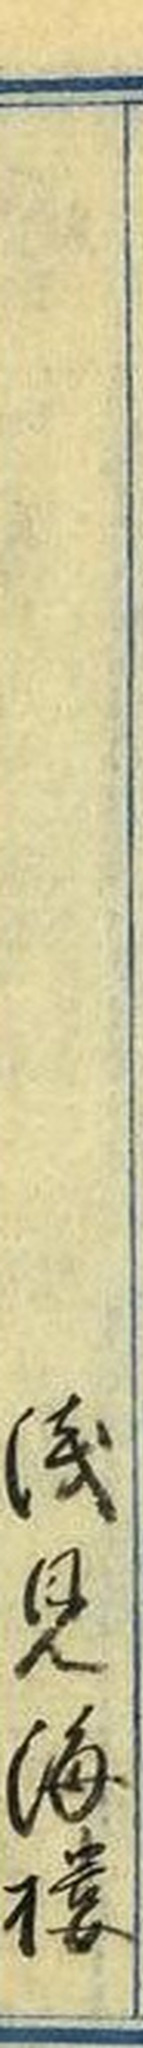浅見海楼
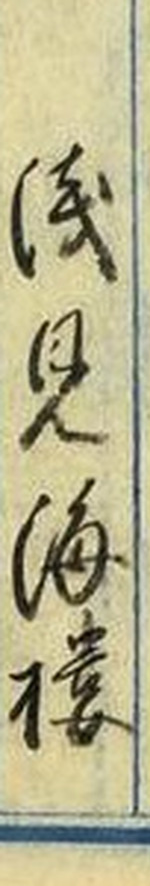浅見海楼
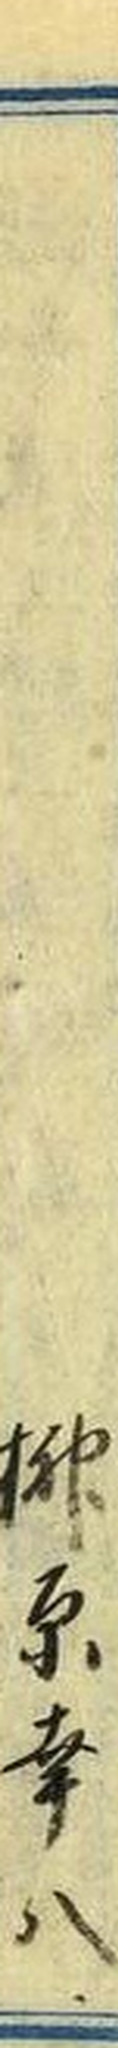榊原幸八
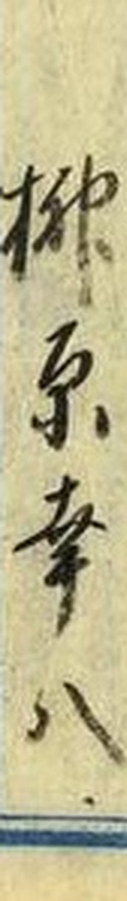榊原幸八
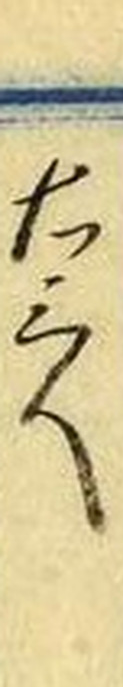右三人
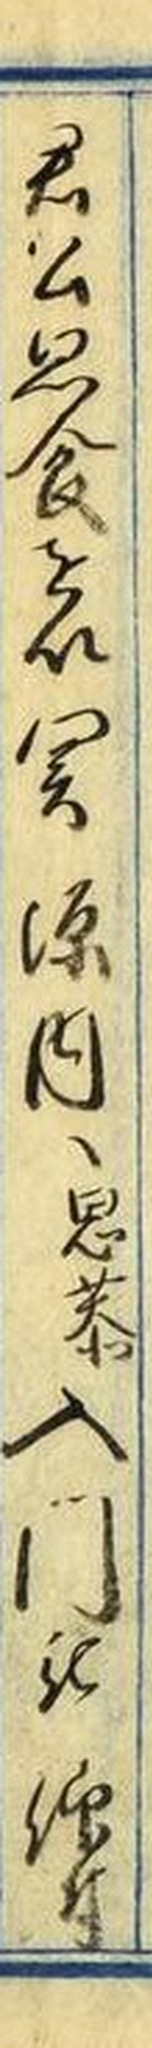君公思食を以関源内へ思慕入門被仰付
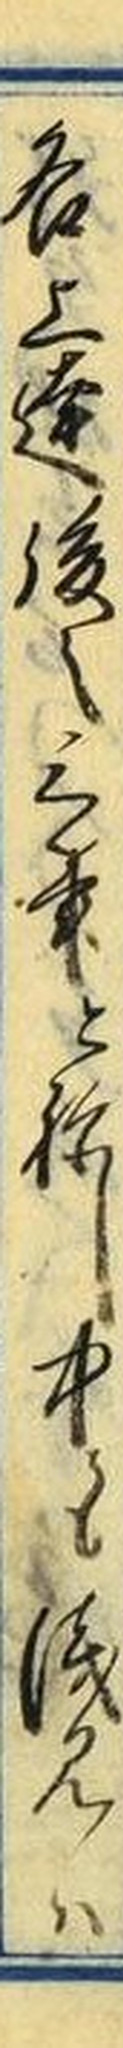各上達後之三筆と称し中にも浅見は

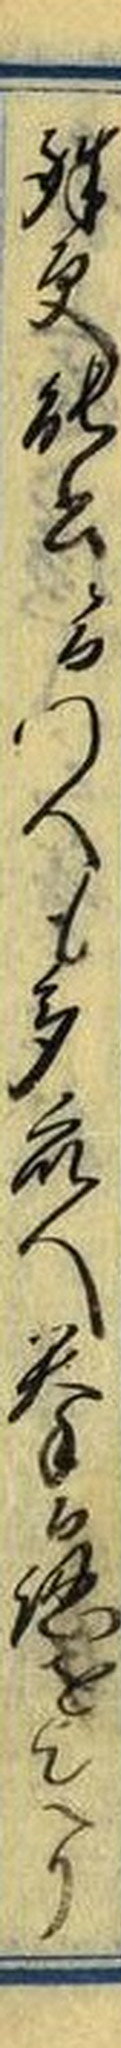殊更能書に而門人も多衆人挙而認を乞へり
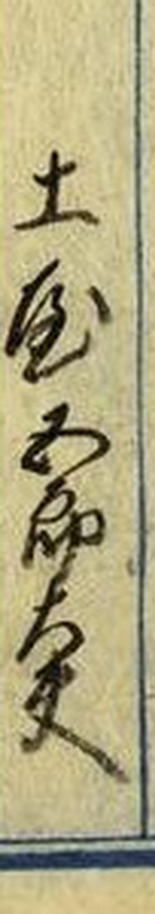土屋五郎大夫
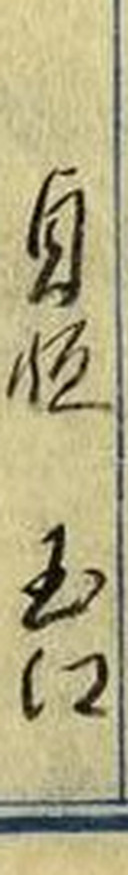貞恒玉江
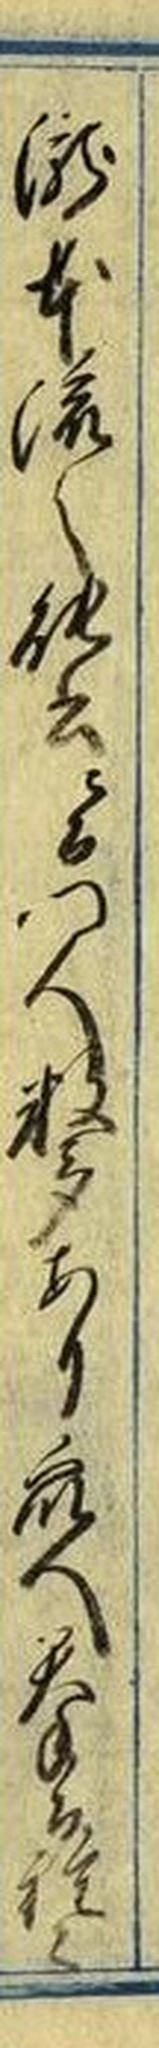瀧本流之能書に而門人数多あり衆人挙而種々
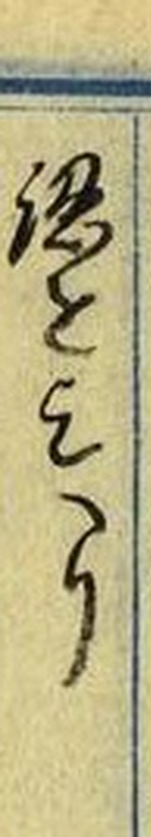認を乞へり
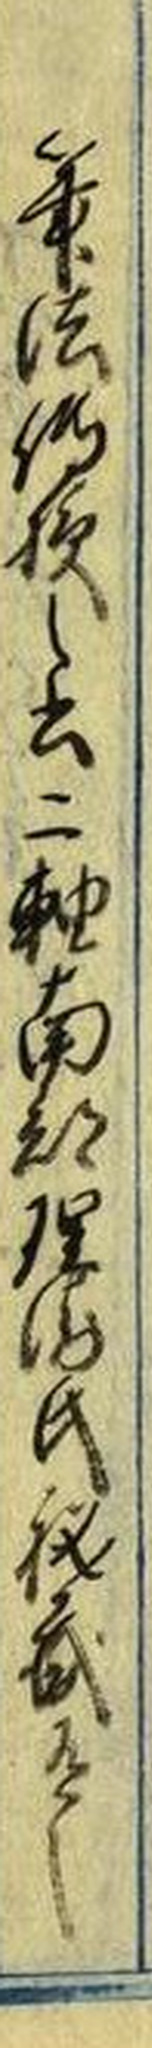筆法伝授之書二軸南部理衛氏秘蔵有之
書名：温古集 四巻
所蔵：福井県文書館 Fukui Prefectural Archives
